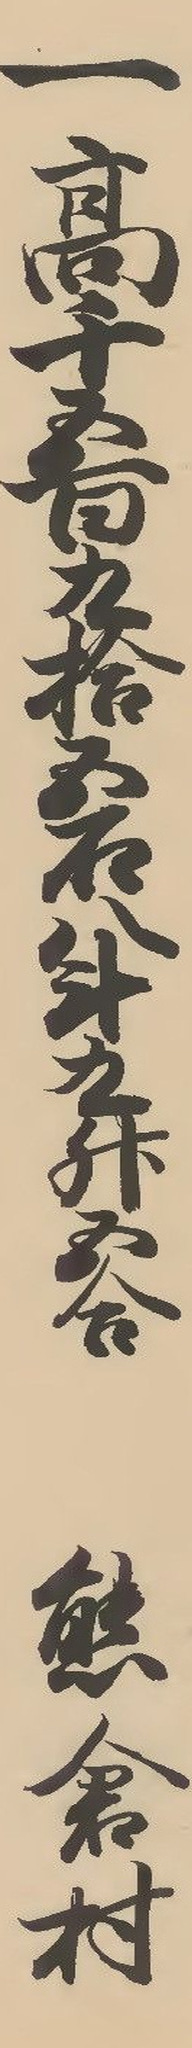一高千五百九拾五石八斗九升五合熊倉村
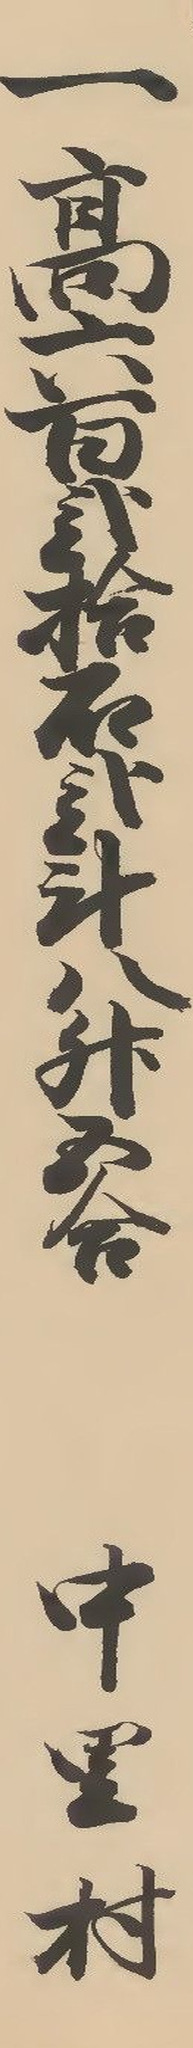一高六百弐拾石弐斗八升五合中里村
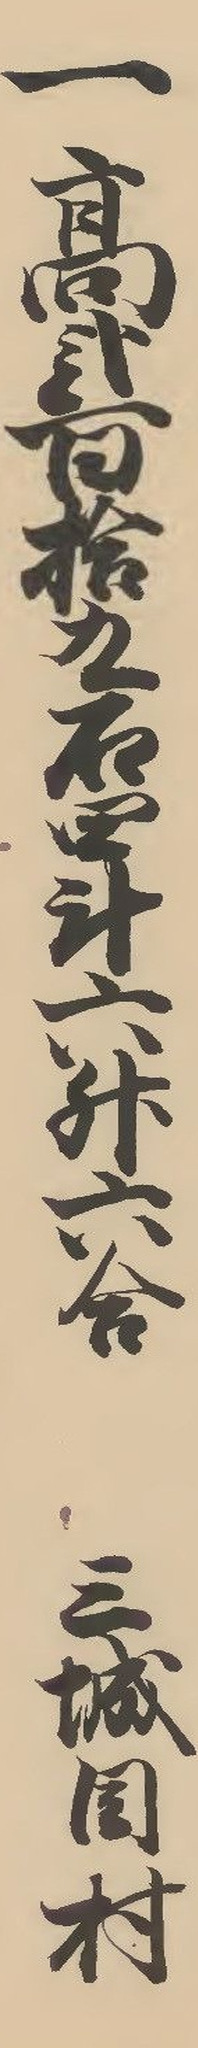一高弐百拾九石四斗六升六合三城目村

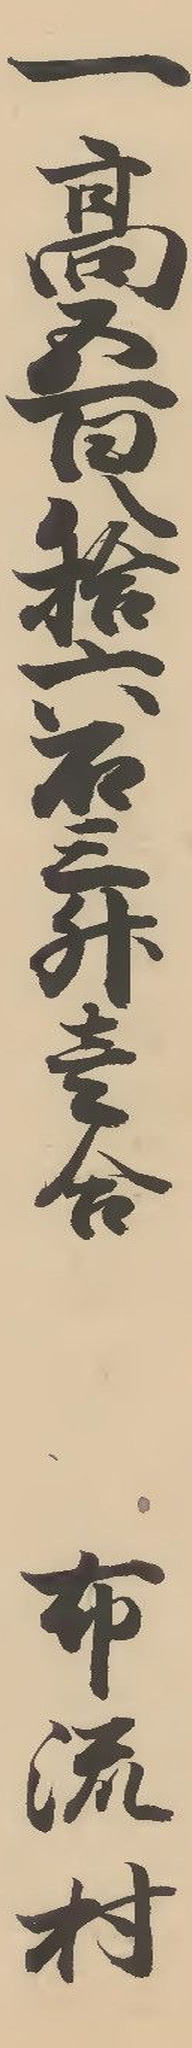一高五百八拾六石三升壱合布流村
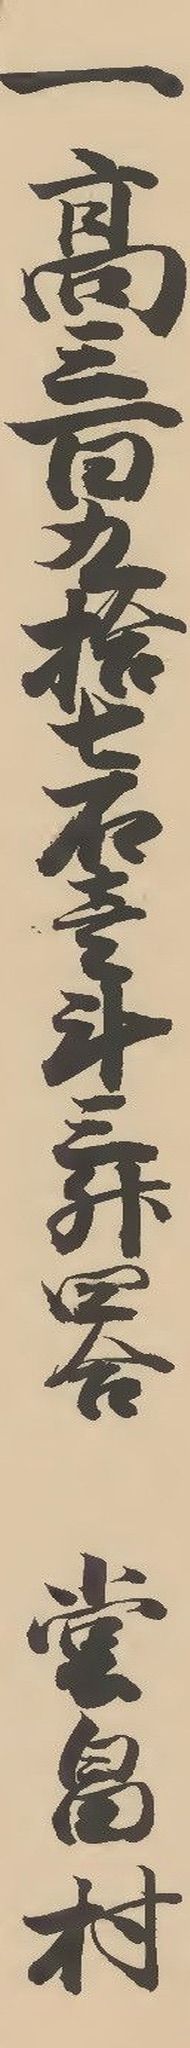一高三百九拾七石壱斗三升四合堂畠村
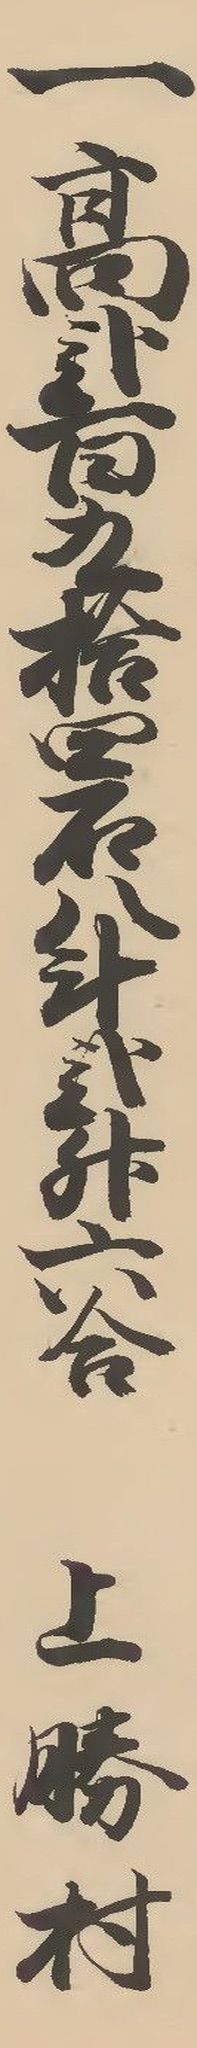一高弐百九拾四石八斗弐升六合上勝村
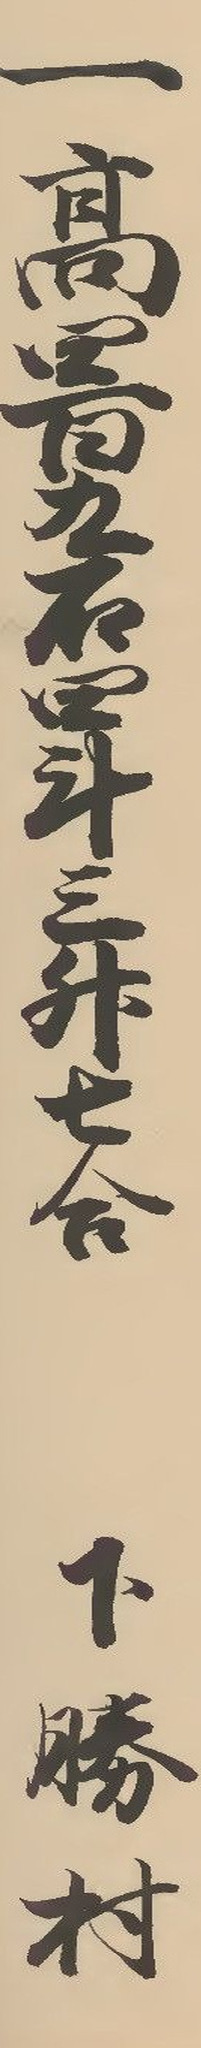一高四百九石四斗三升七合下勝村
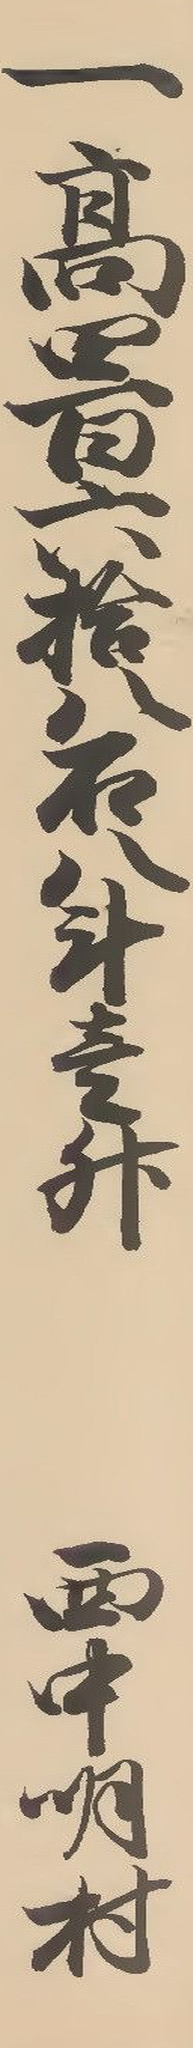一高四百六拾八石八斗壱升西中明村
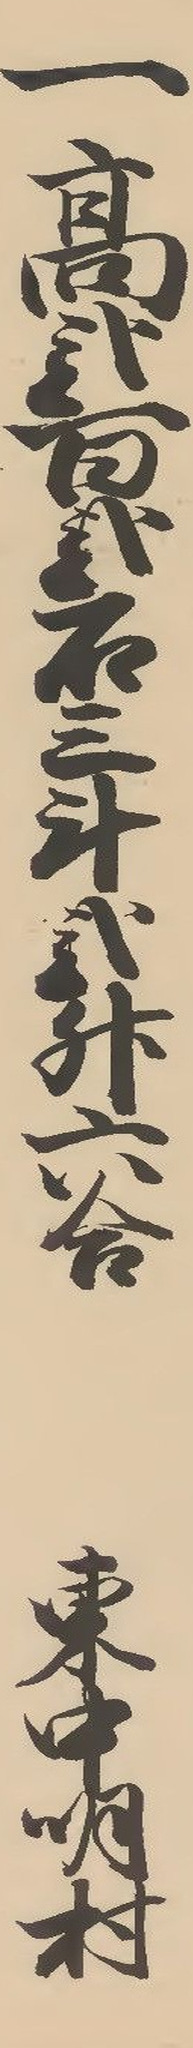一高弐百弐石三斗弐升六合東中明村
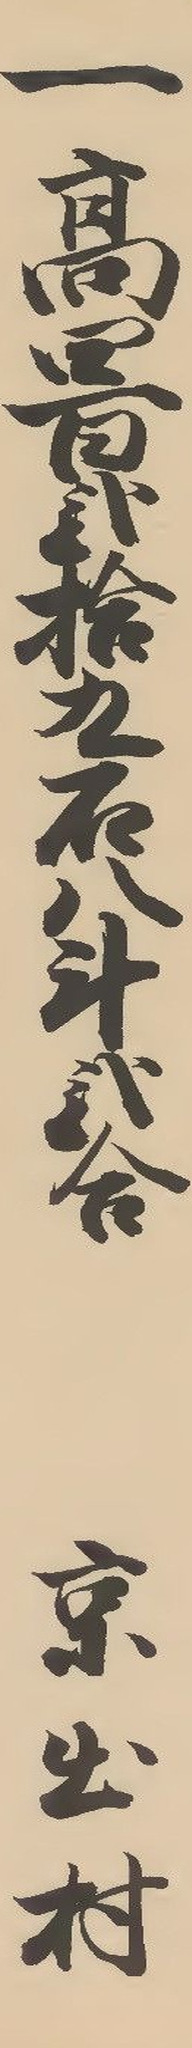一高四百弐拾九石八斗弐合京出村
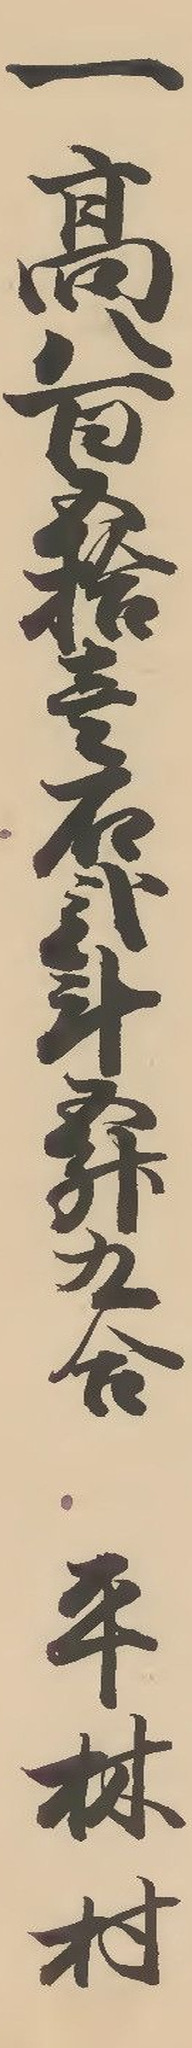一高八百五拾壱石弐斗五升九合平林村

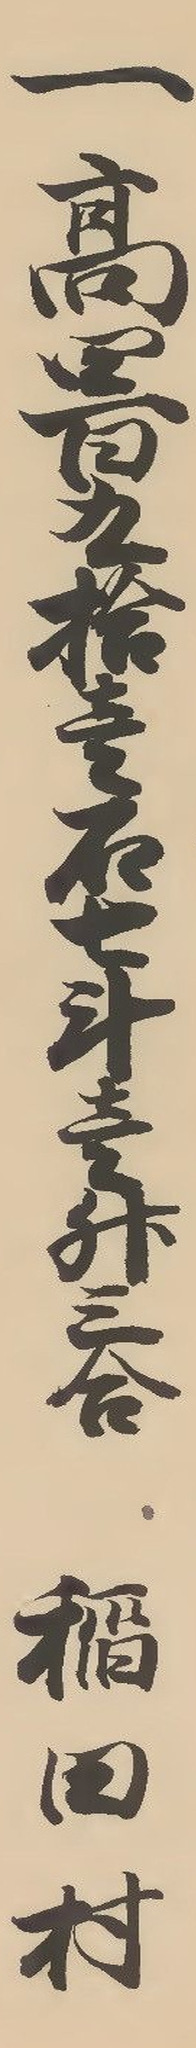一高四百九拾壱石七斗壱升三合稲田村
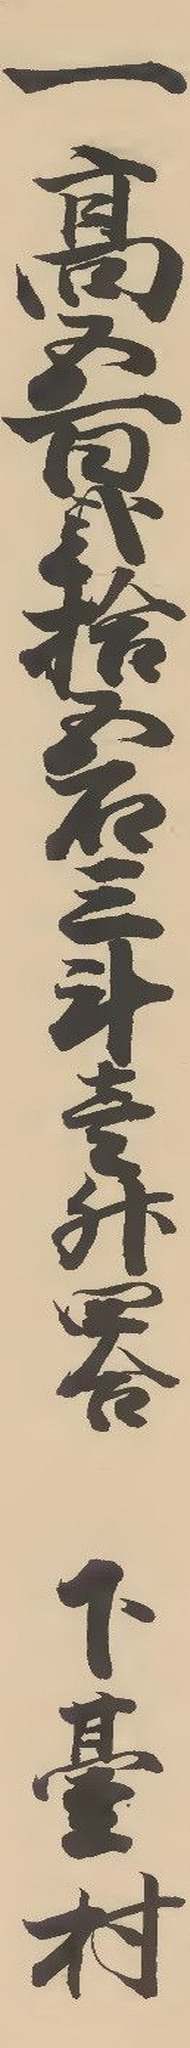一高五百弐拾五石三斗壱升四合下台村
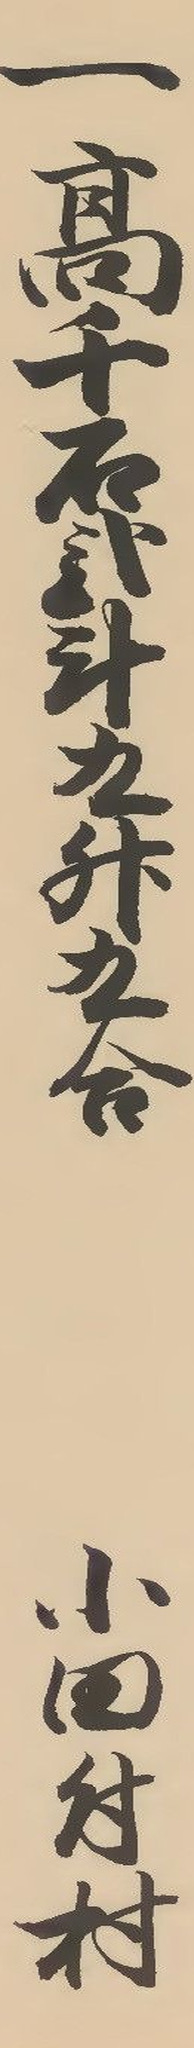一高千石弐斗九升五合小田付村
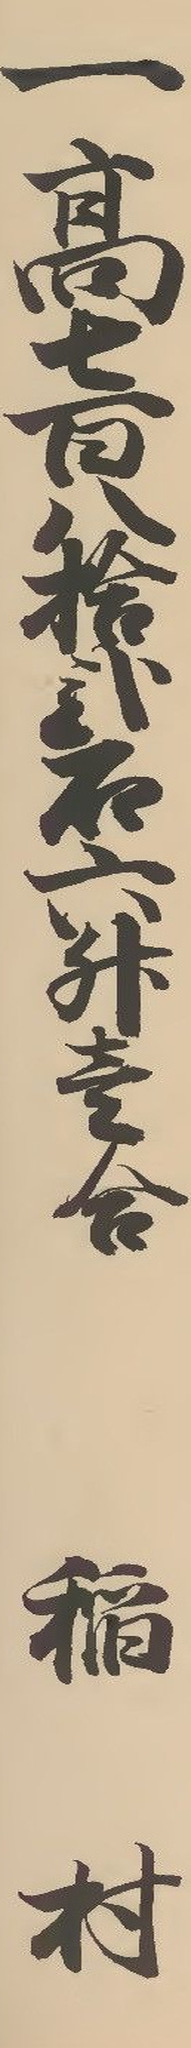一高七百八拾弐石六升壱合稲村
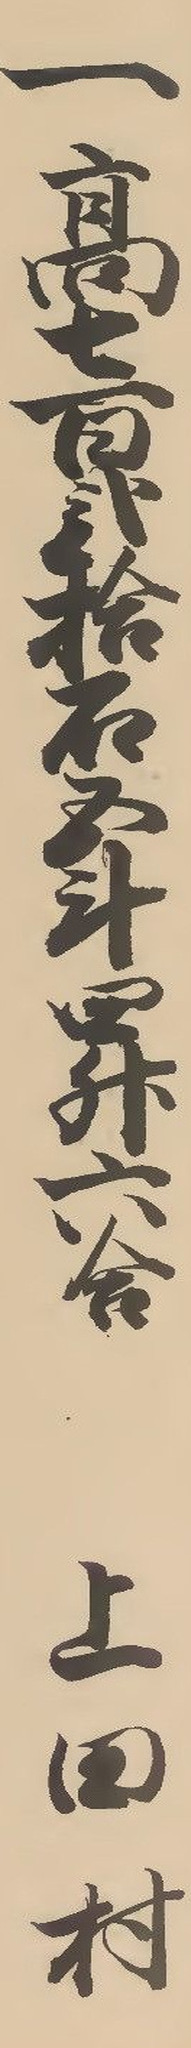一高七百弐拾石五斗四升六合上田村
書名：陸奥国郷帳　１
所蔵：国立公文書館 National Archives of Japan
